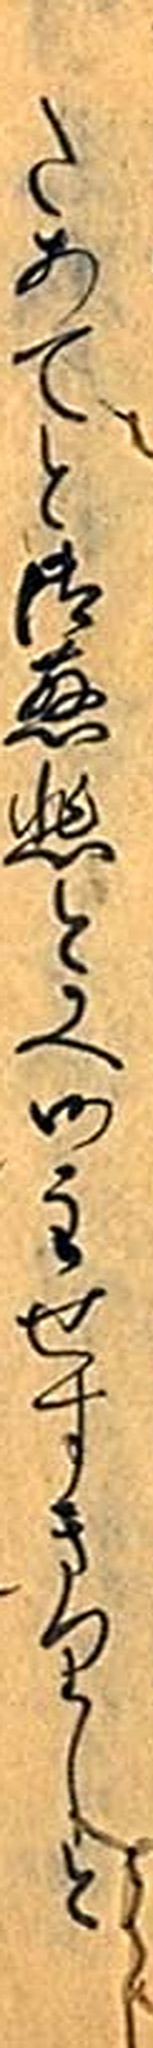たあてと御慈悲と又御主せすきりしと
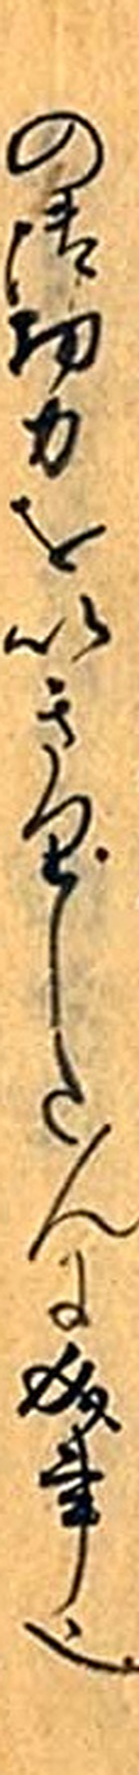の御功力を以きりしたんに成事也
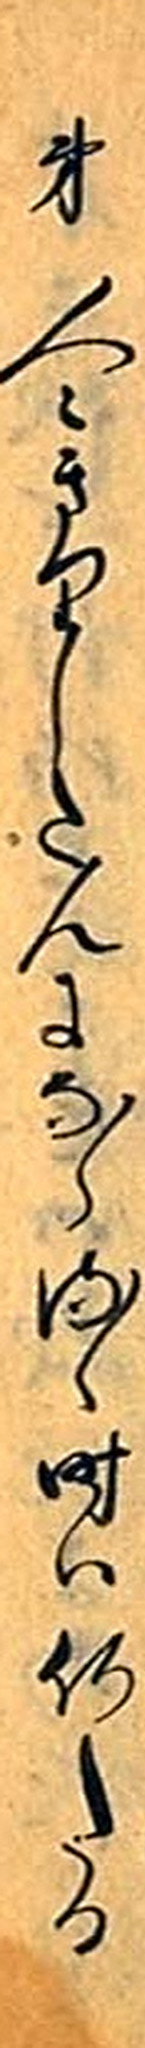弟人々きりしたんにならるゝ時は何たる
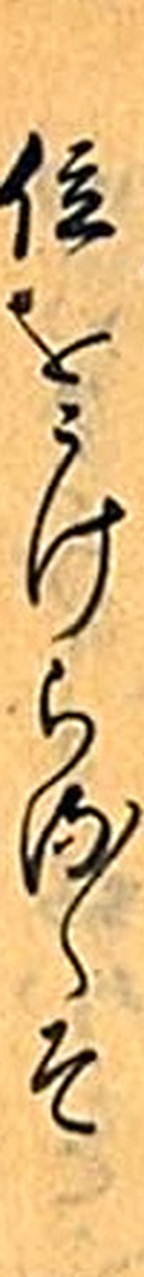位をうけらるゝそ
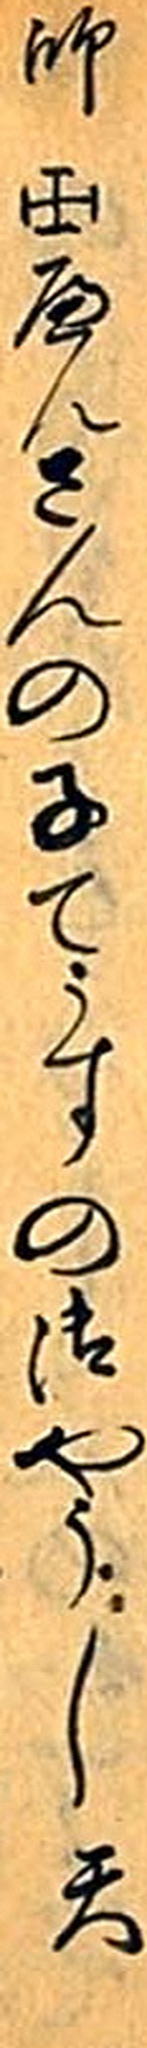師☩へんさんの子てうすの御やうし天
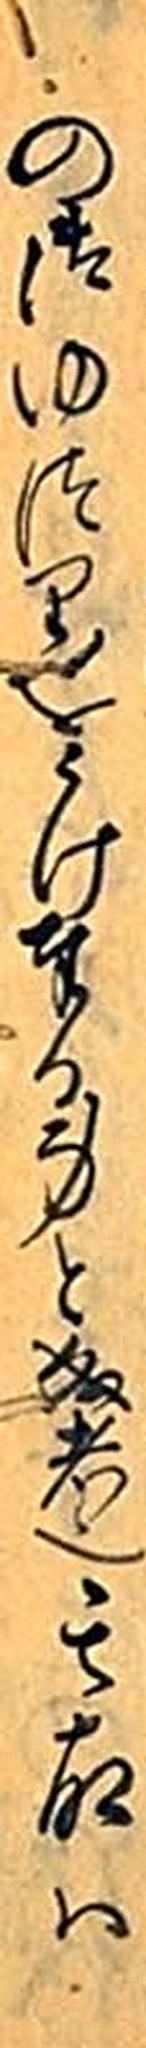の御ゆつりをうけ奉る身と成者也其故は
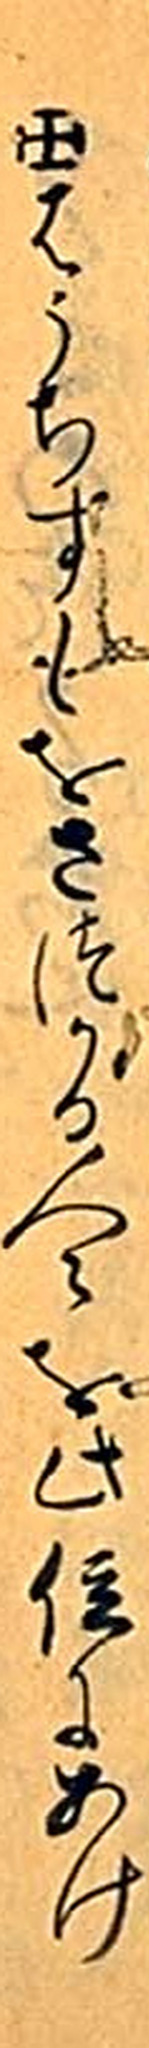☩はうちすもをさつかる人々を此位にあけ
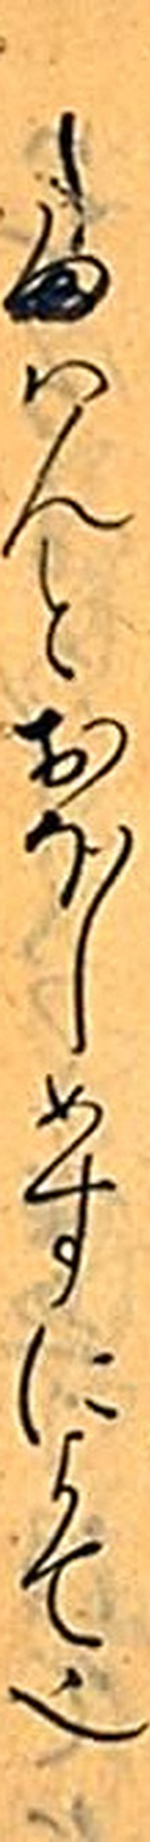たまはんとおほしめすによて也
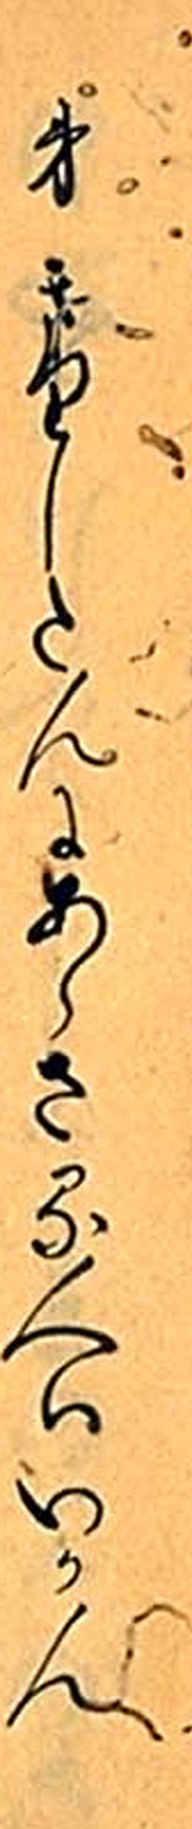弟きりしたんにあらさる人はいかん
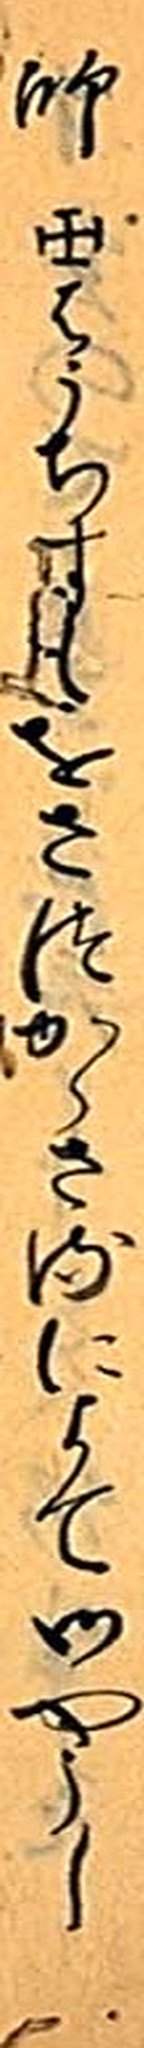師☩はうちすもをさつからさるによて御やうし
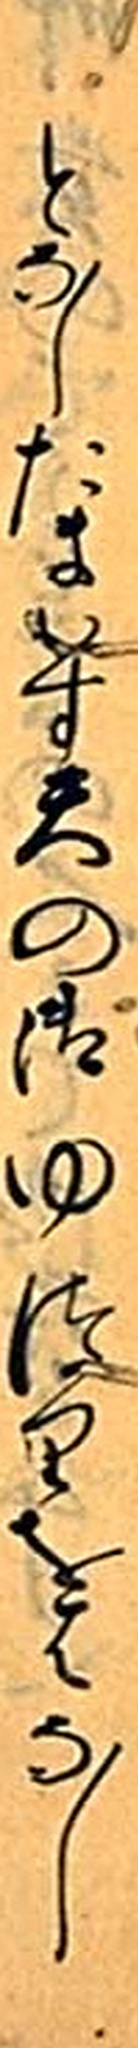となしたまはす天の御ゆつりをはなし
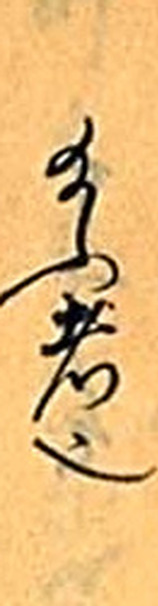給ふ者也
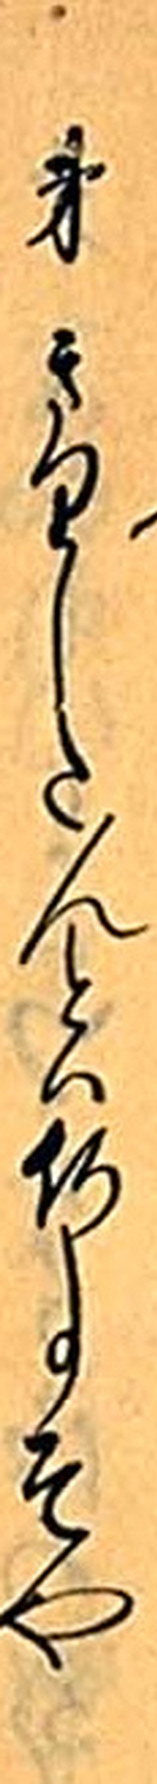弟きりしたんとは何事そや
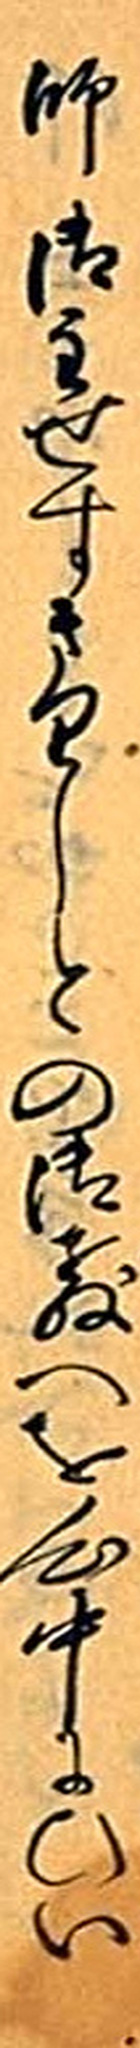師御主せすきりしとの御教へを心中にひい
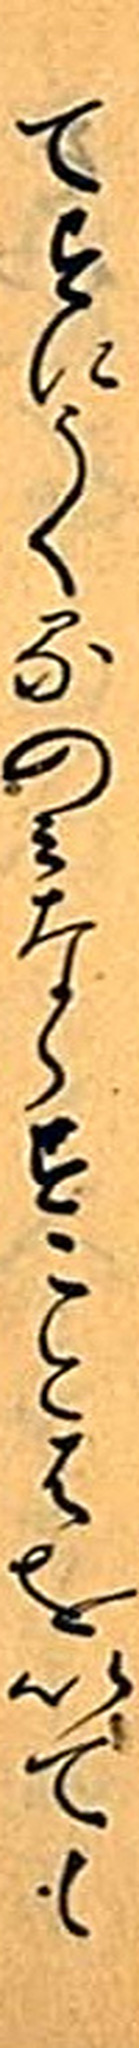てすにうくるのみならすことはを以ても
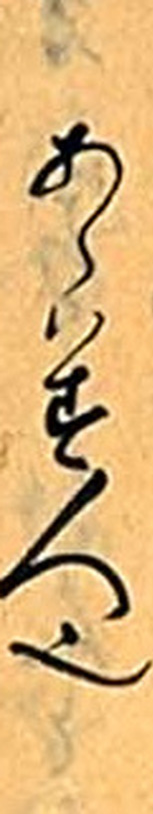あらはす人也
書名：ドチリナ・キリシタン
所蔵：東京大学総合図書館 / General Library in the University of Tokyo
